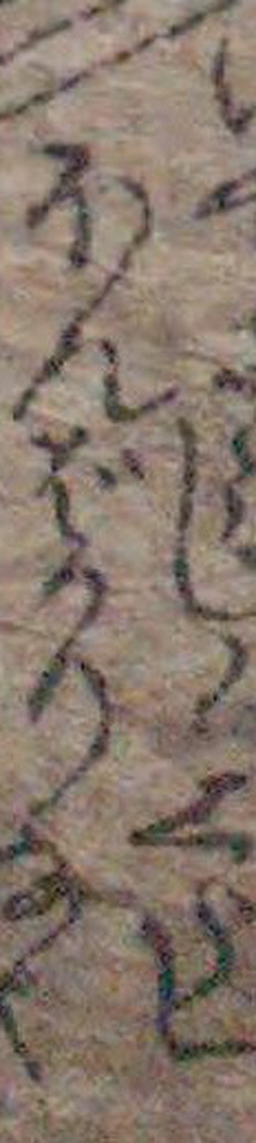ほんばかりなぐ
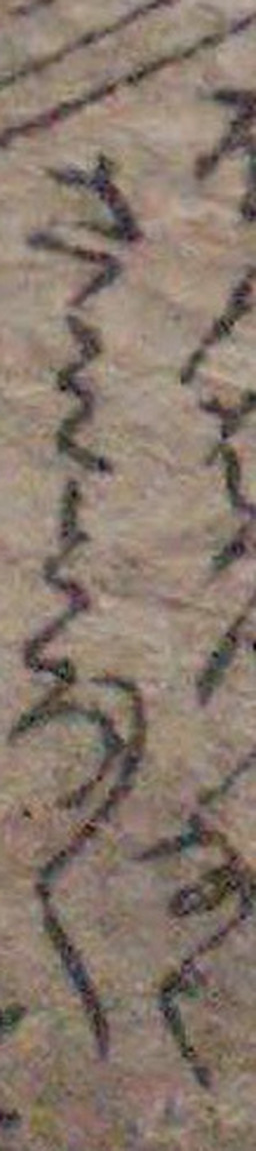さみとろ〳〵と
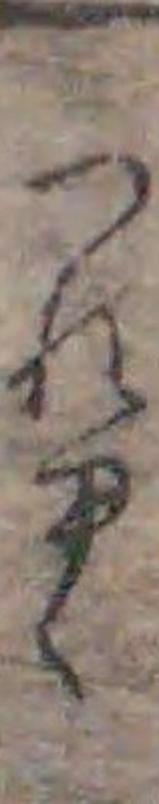つれゆく

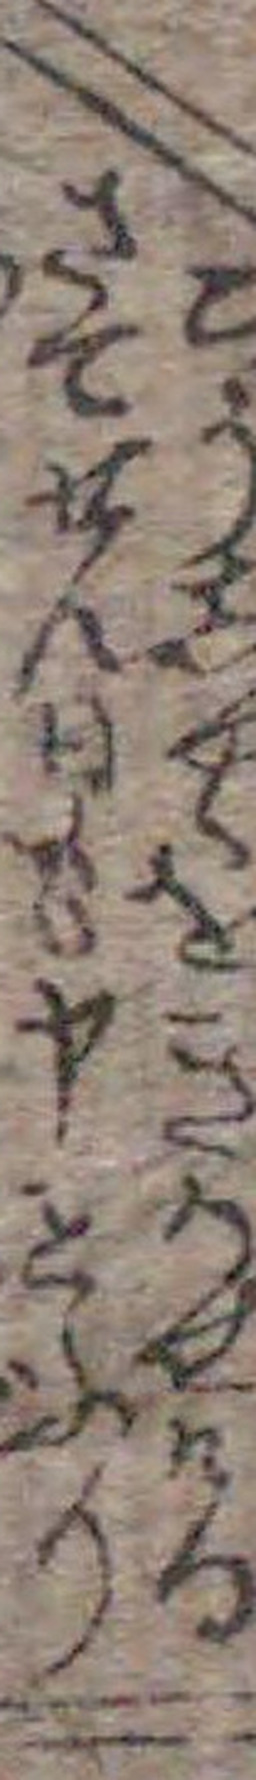さてせん日も申とふり
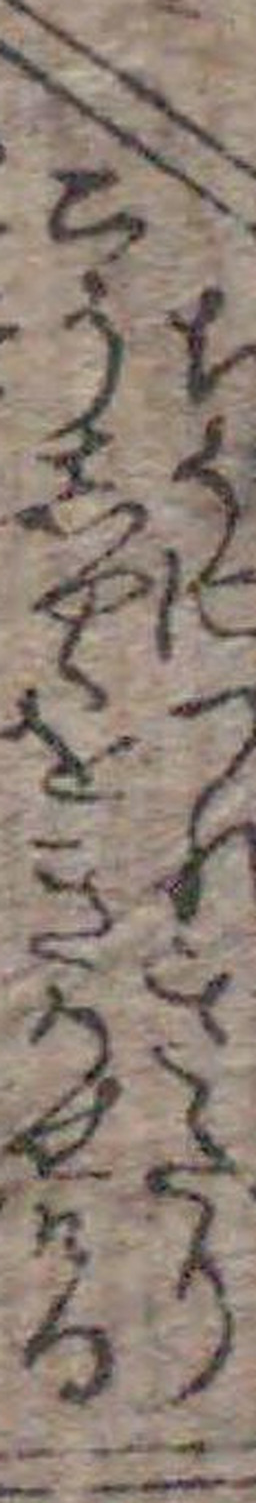こうしやくをきかせける
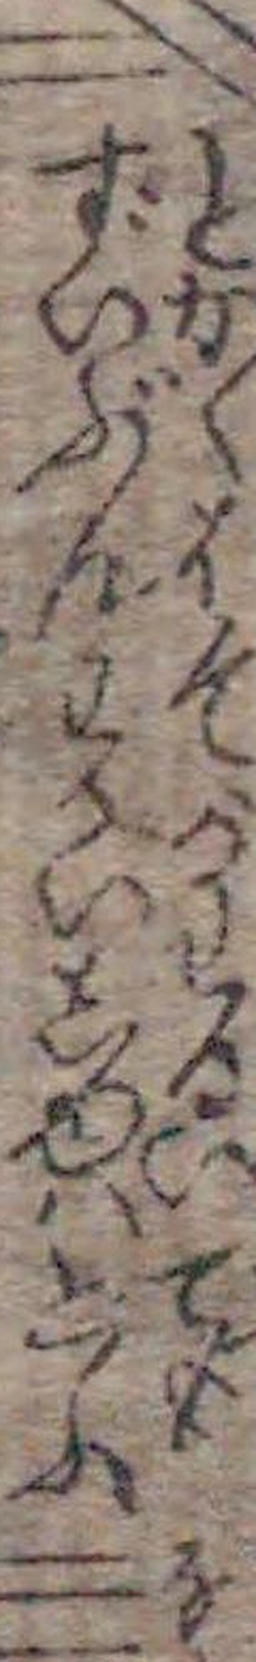ずいぶんわかいしゆはとふ
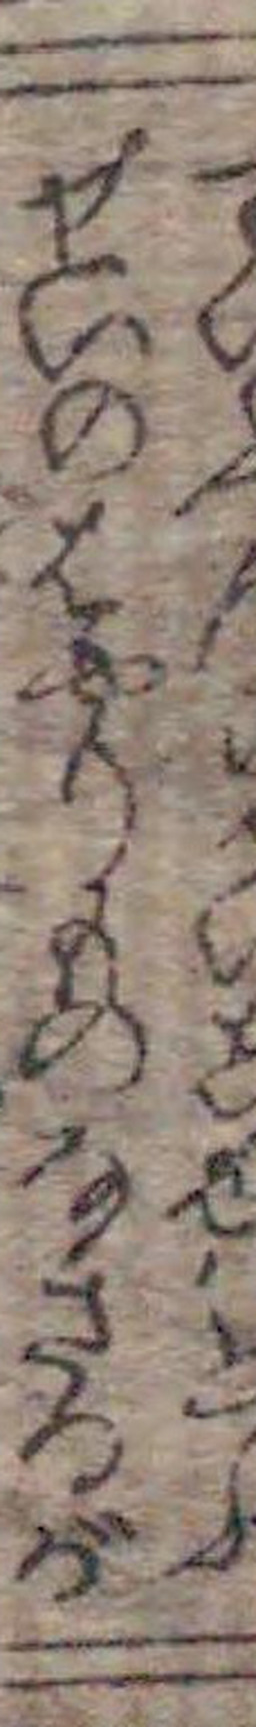せいのはやりものなさるが
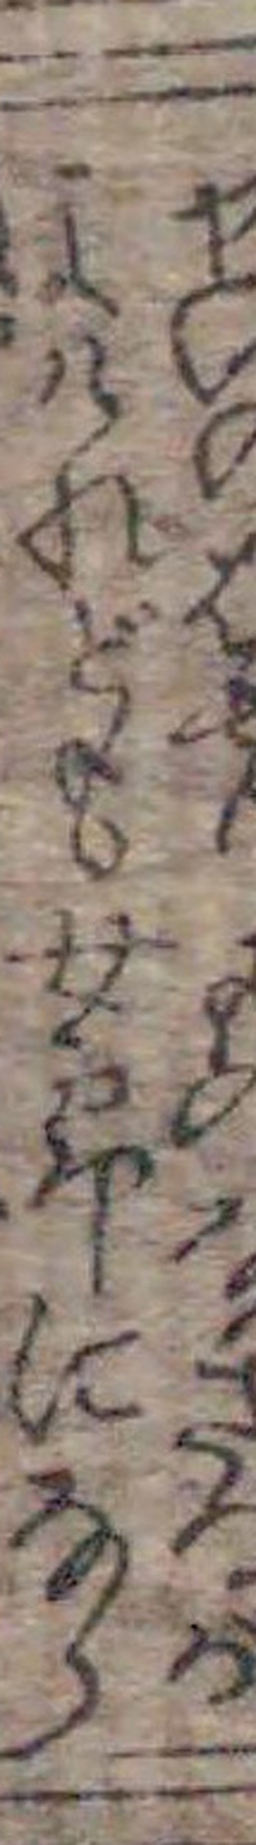よはけれども女郎になら
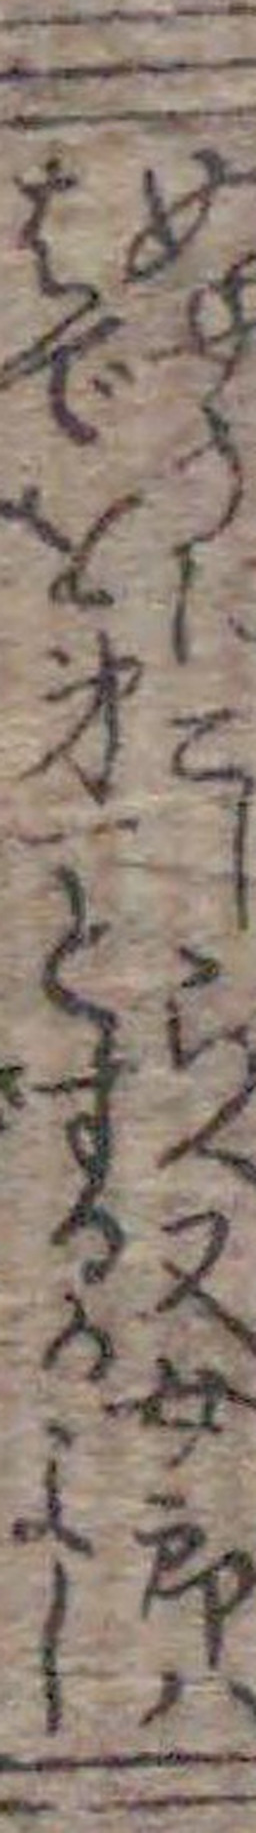はでを第一とするかよし
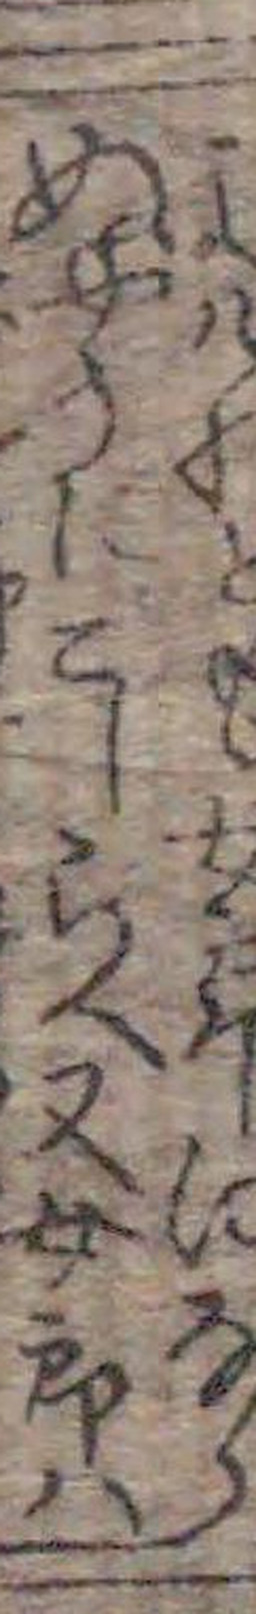ぬやうにこしらへ又女郎は
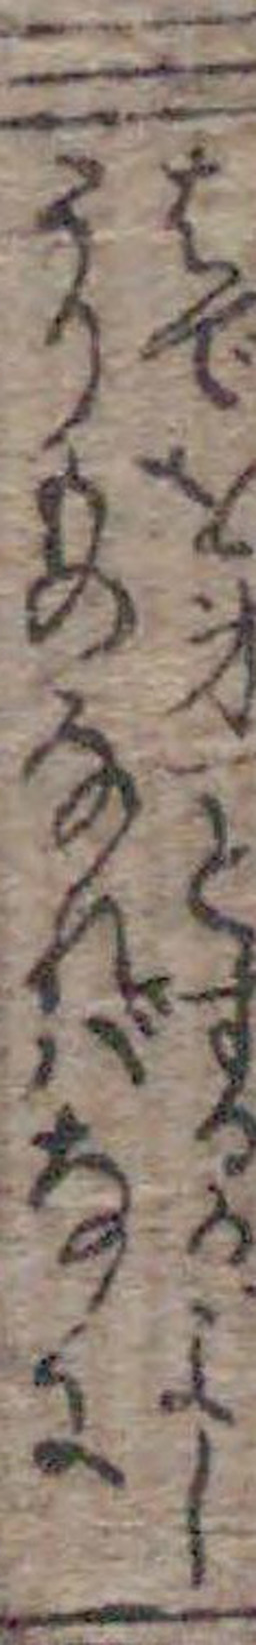うりものなればなに
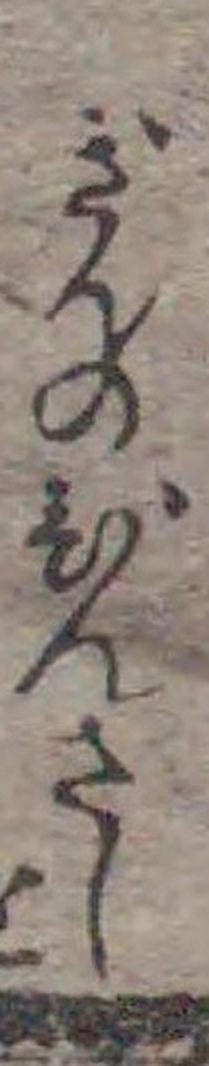ぎんのびんさしを
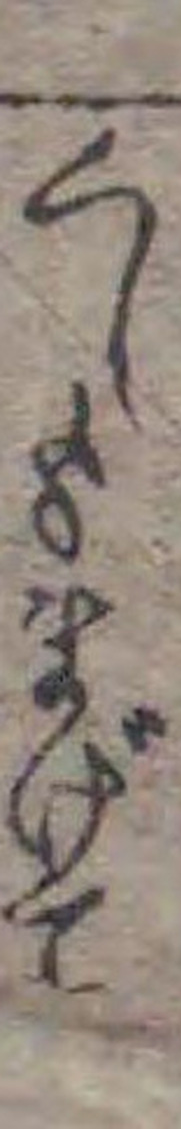くしもまげて
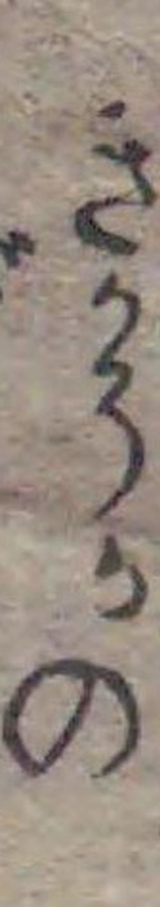きかうかの
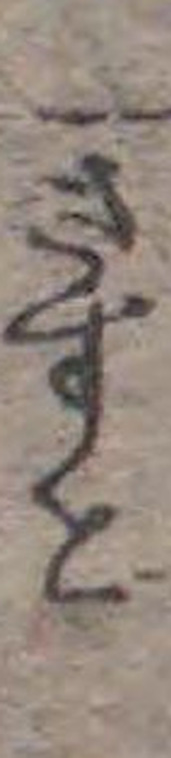さすと
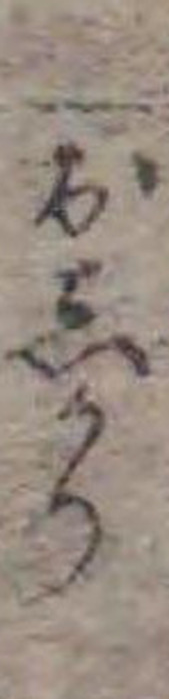おしかり
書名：神田与吉一代記 : 3巻
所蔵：国立国会図書館 National Diet Library, JAPAN
